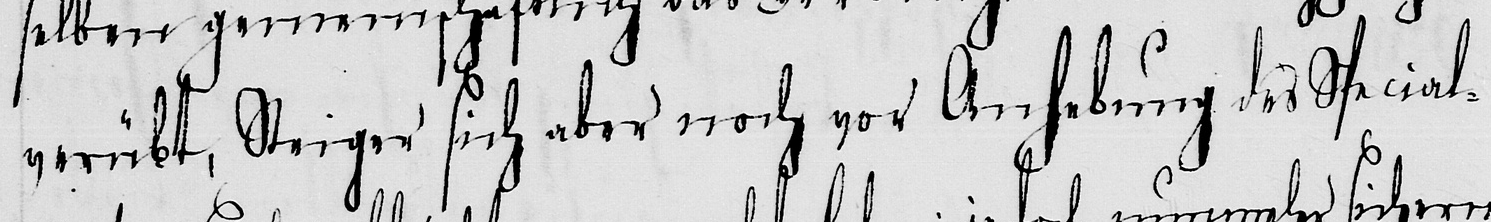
verübt, Steiger sich aber noch vor Anhebung des Special¬
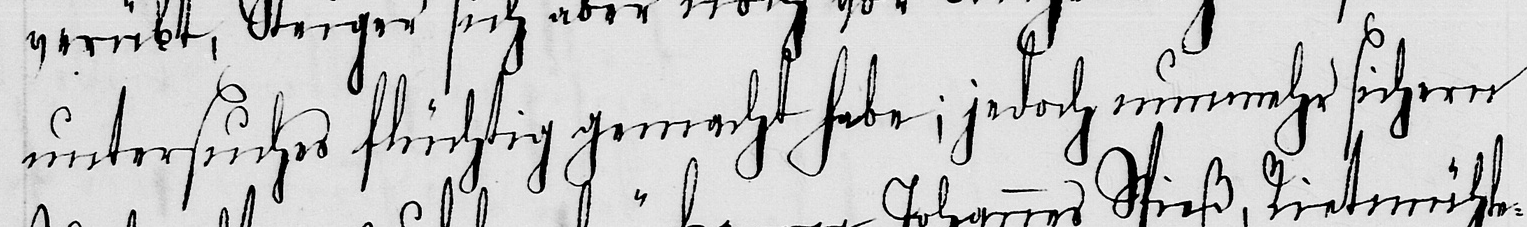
untersuches flüchtig gemacht habe; jedoch nunmehr sichern
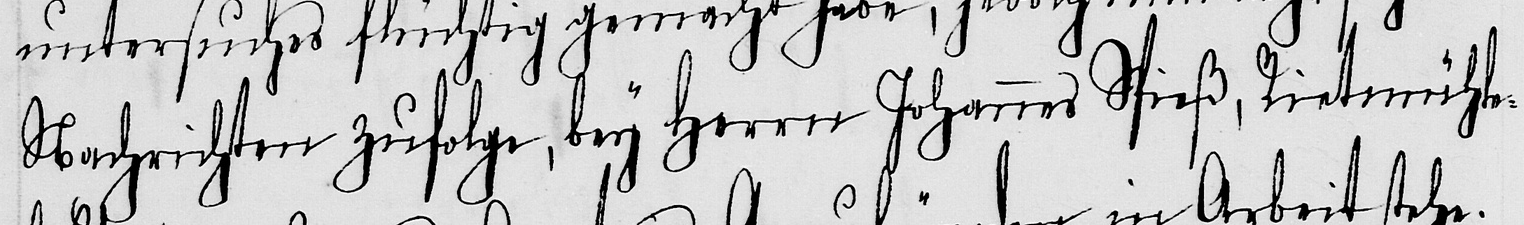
Nachrichten zufolge, bey Herrn Johannes Spieß, Rietmühl¬
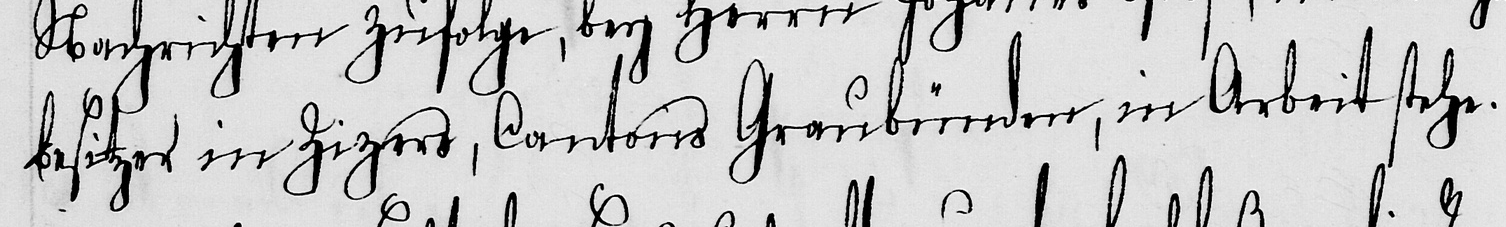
ebesitzer in Zizers, Cantons Graubünden, in Arbeit stehe.
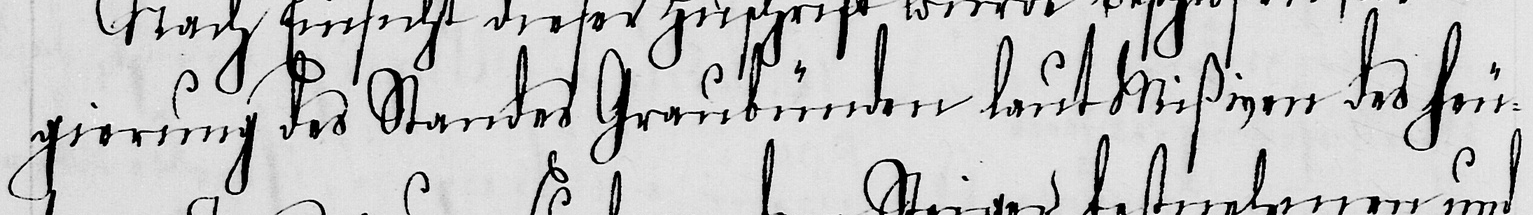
gierung des Standes Graubünden laut Mißiven des heu¬
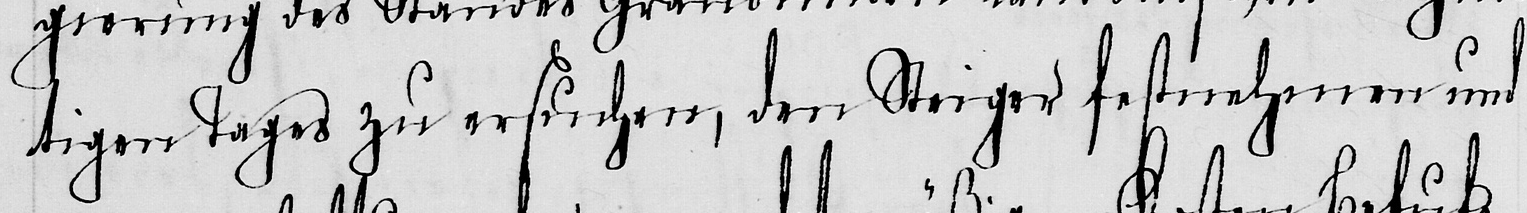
tigen Tages zu ersuchen, den Steiger festnehmen und
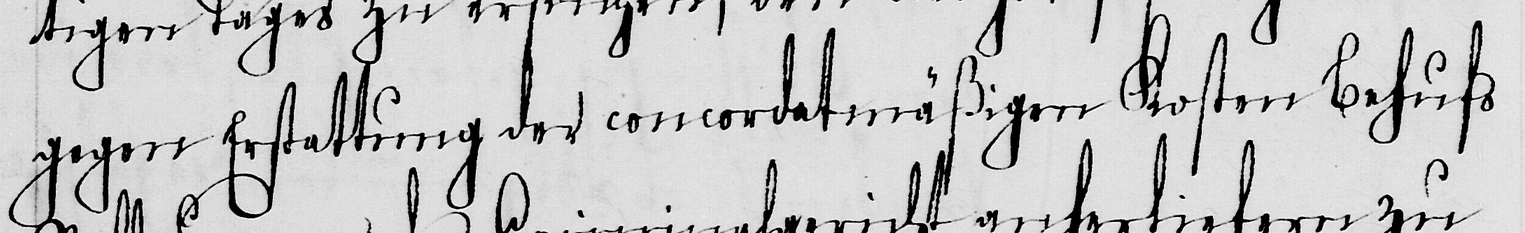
gegen Erstattung der concordatmäßigen Kosten Behufs
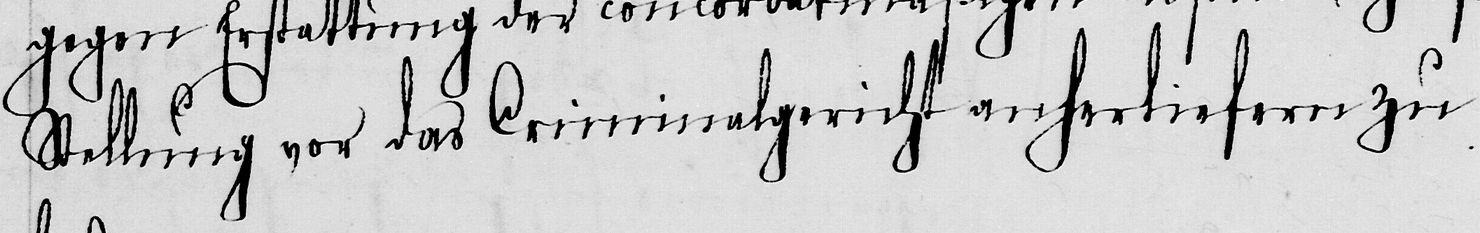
Stellung vor das Criminalgericht anherliefern zu
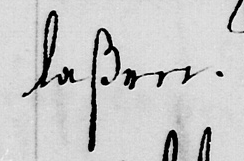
laßen.
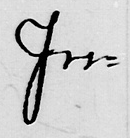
den
